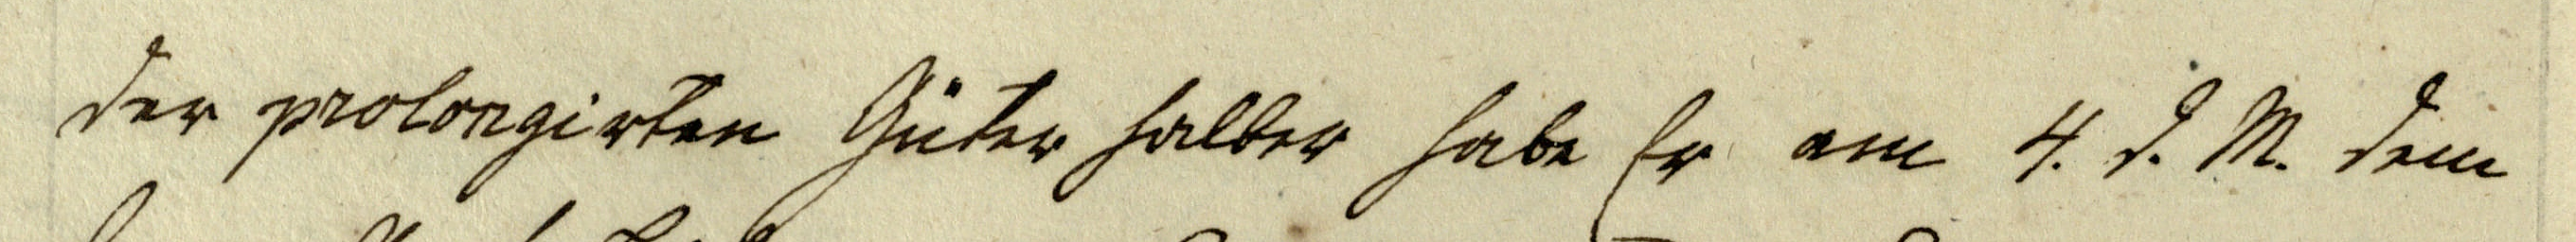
der prolongirten Güter halber habe Er am 4. d. M. dem
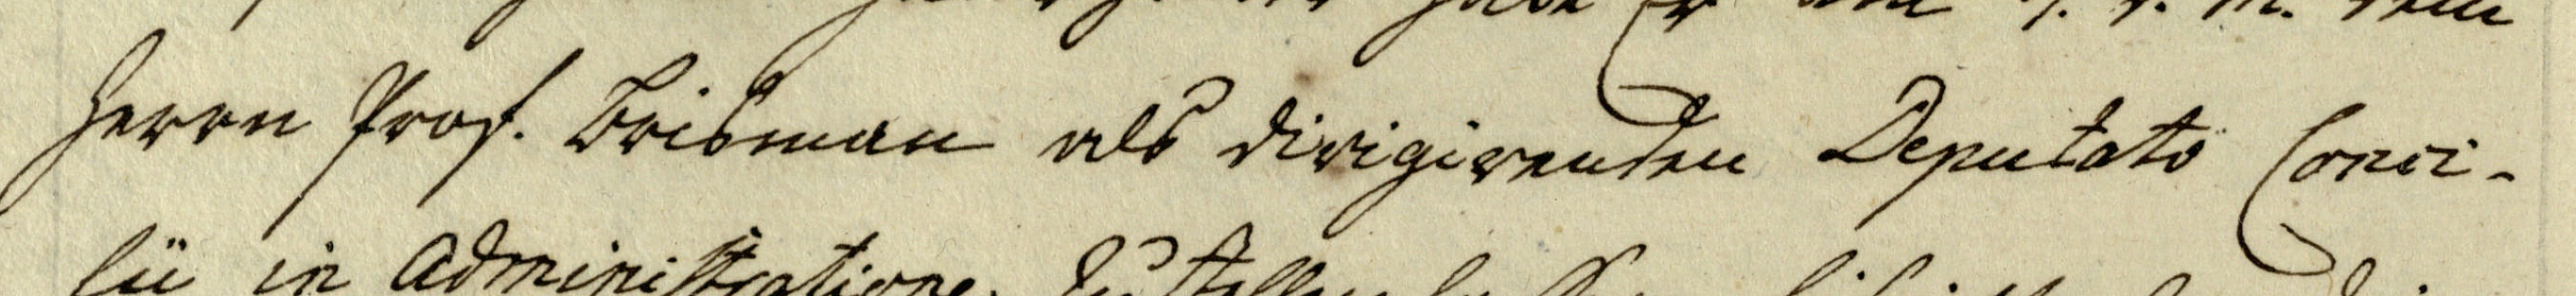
Herrn Prof. Brisman als dirigirenden Deputato Conci¬
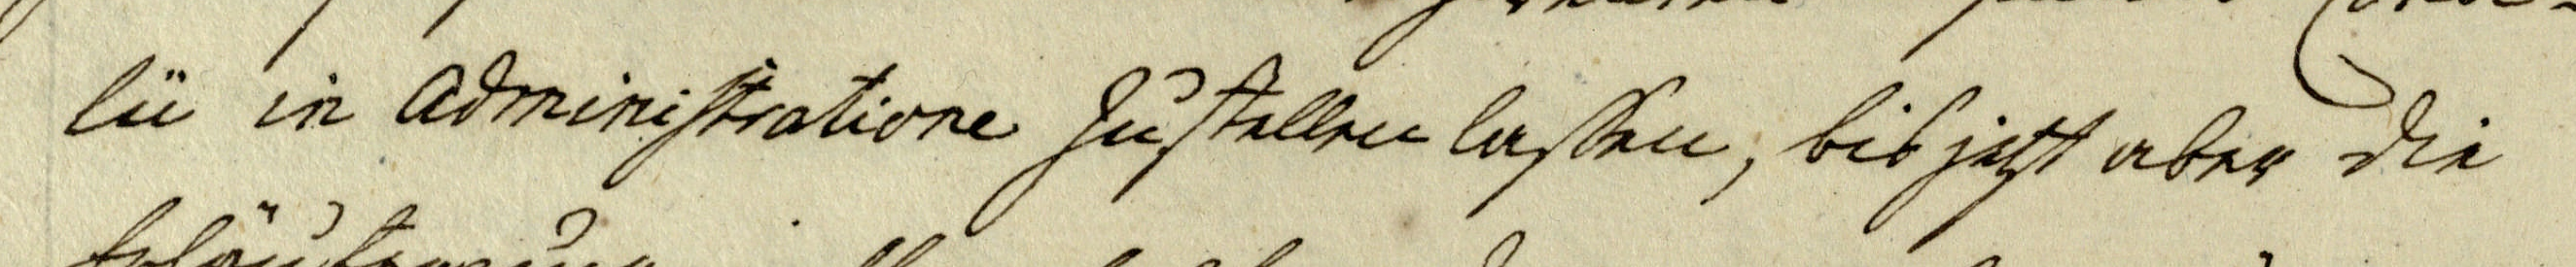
lii in Administratione zustellen lassen, bis jetzt aber die
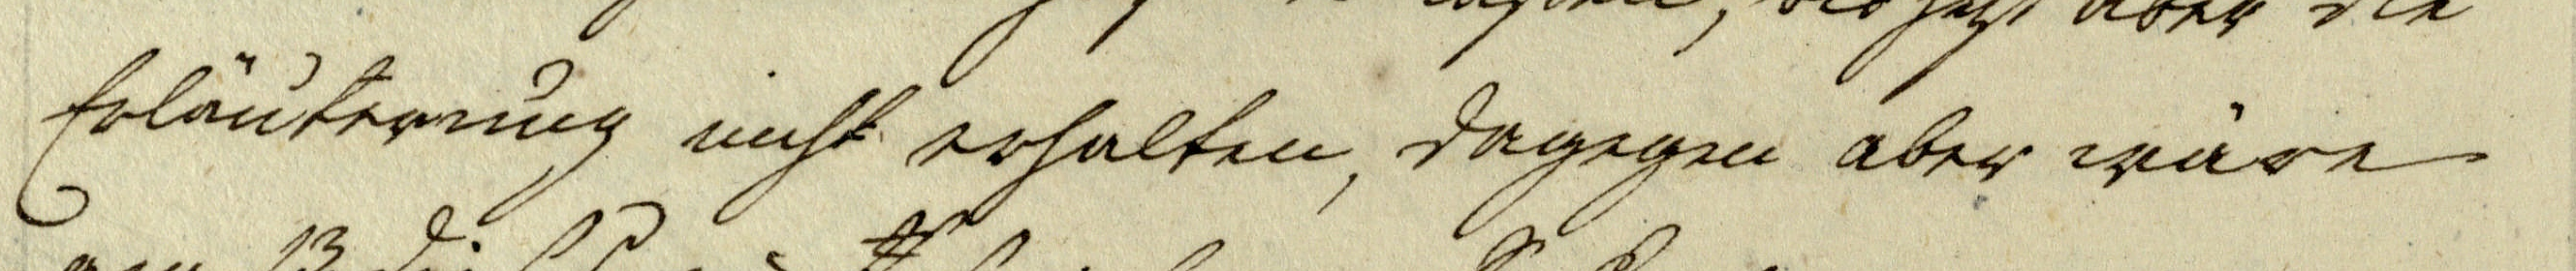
Erläuterung nicht erhalten, dagegen aber wäre
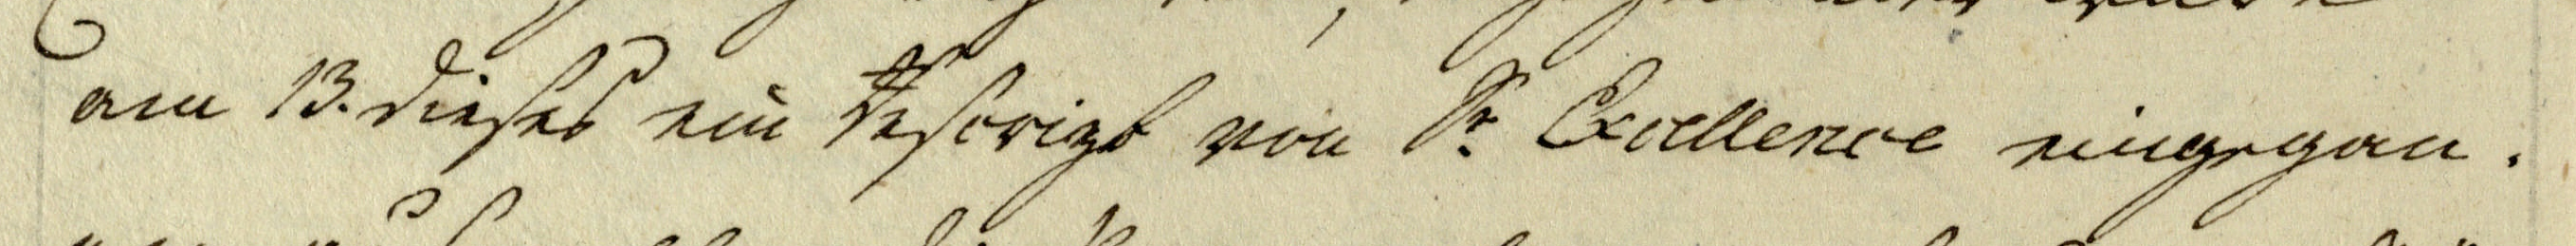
am 13. dieses ein Rescript von Sr Excellence eingegan¬
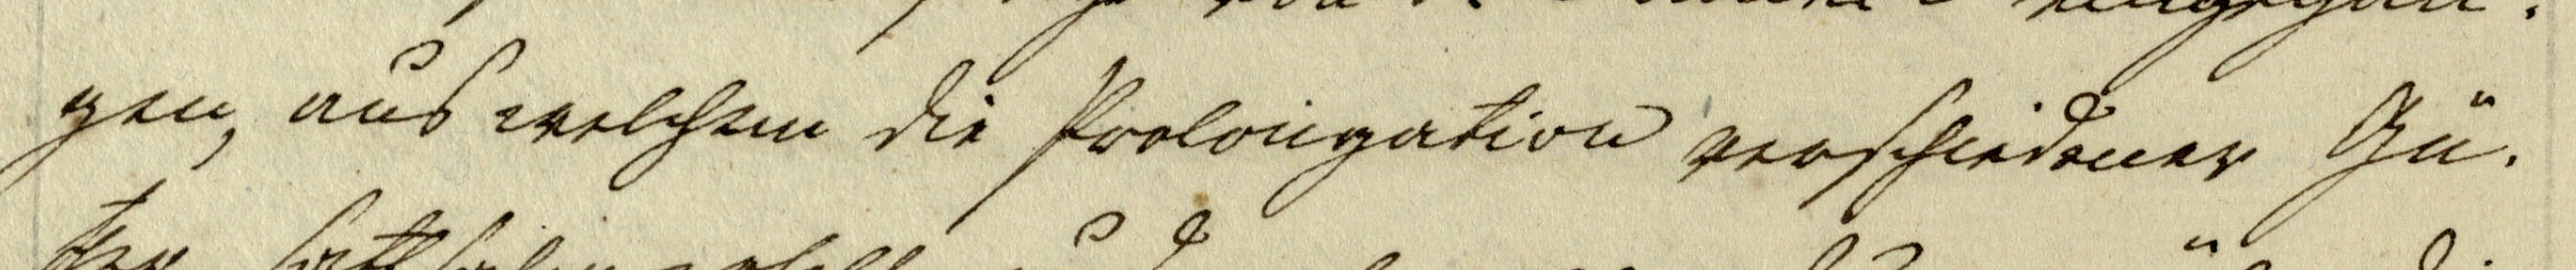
gen, aus welchem die Prolongation verschiedener Gü
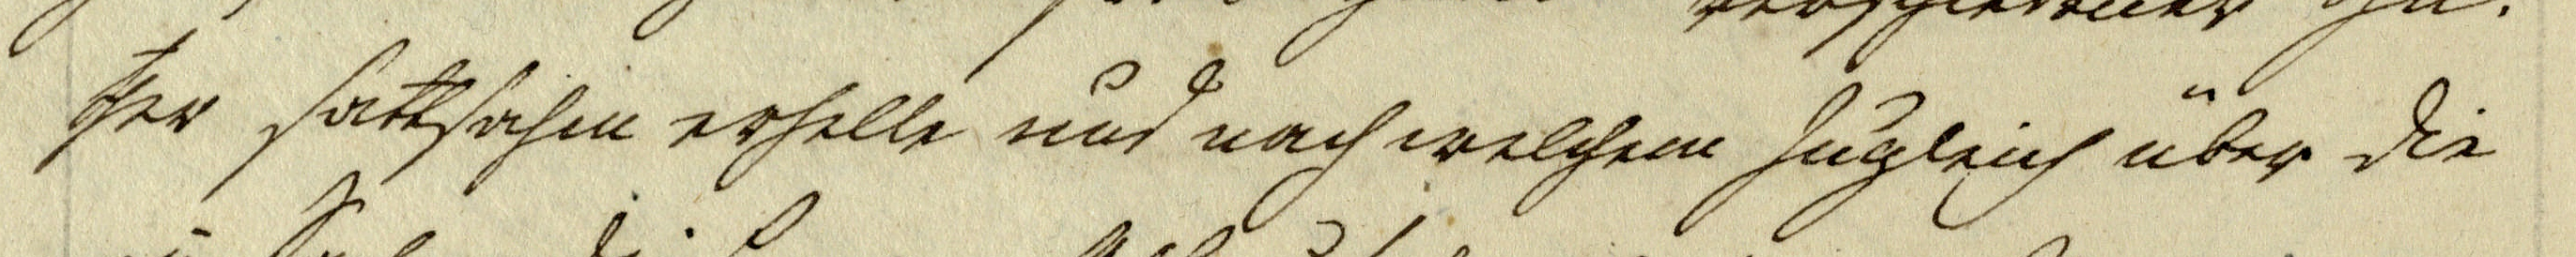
ther sattsahm erhelle und nach welchem zugleich über die
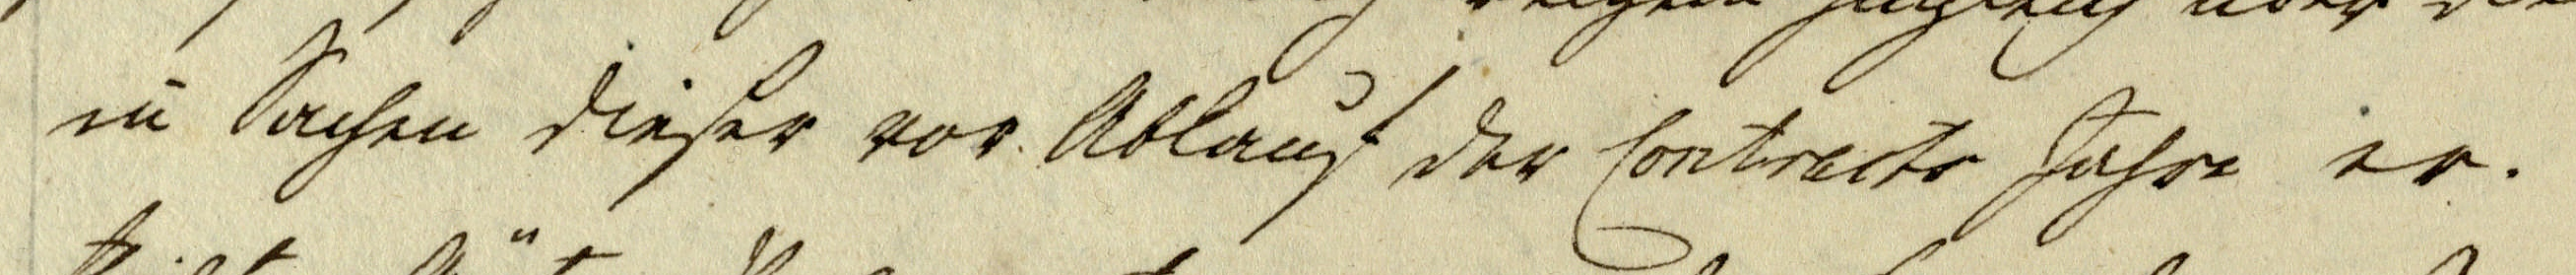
in Sachen dieser vor Ablauf der Contracts Jahre er¬
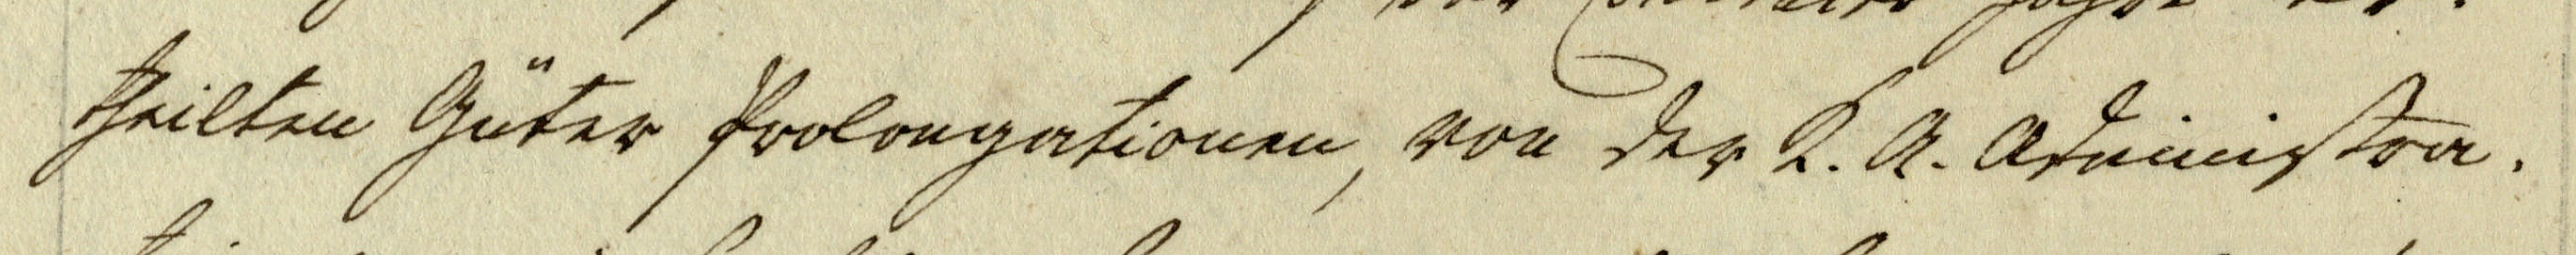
theilten Güter Prolongationen von der K. A. Administra¬
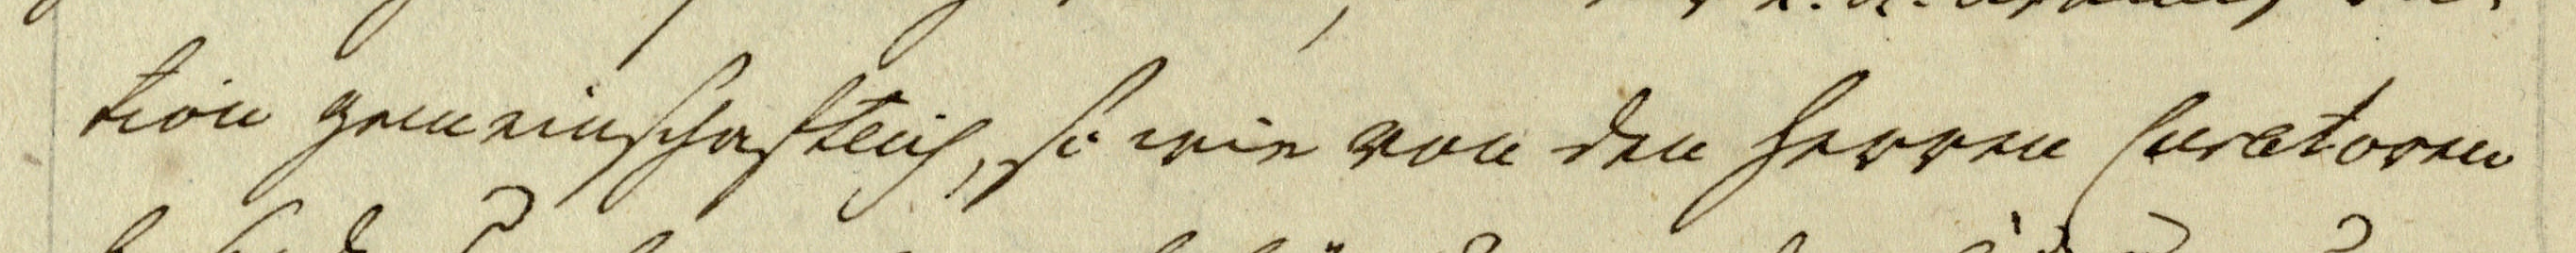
tion gemeinschaftlich, so wie von den Herren Curatoren
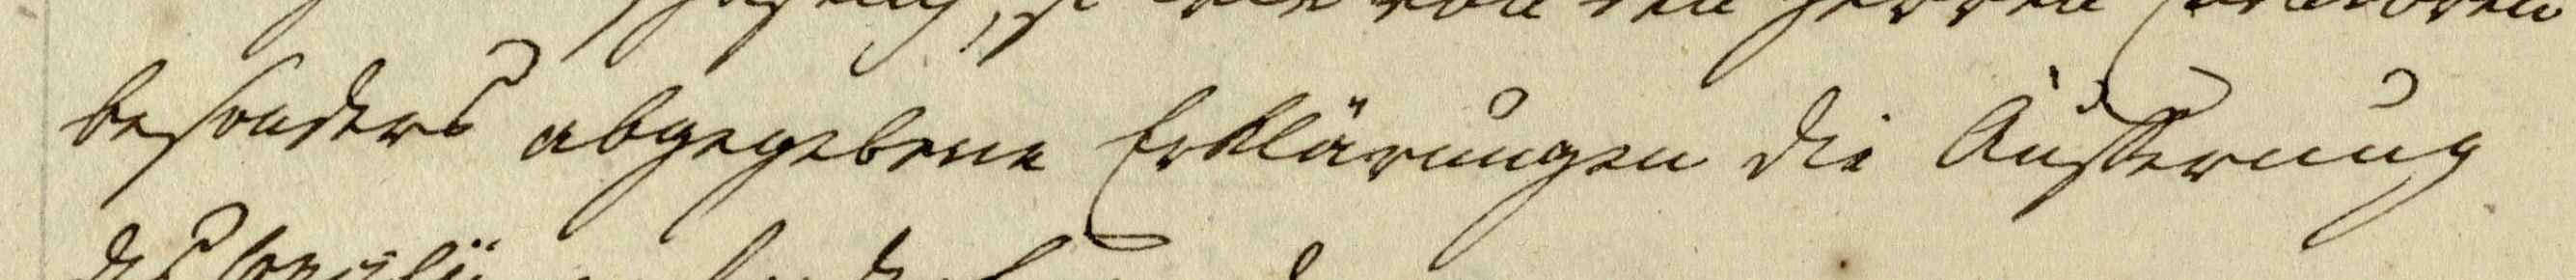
besonders abgegebene Erklärungen die Äusserung
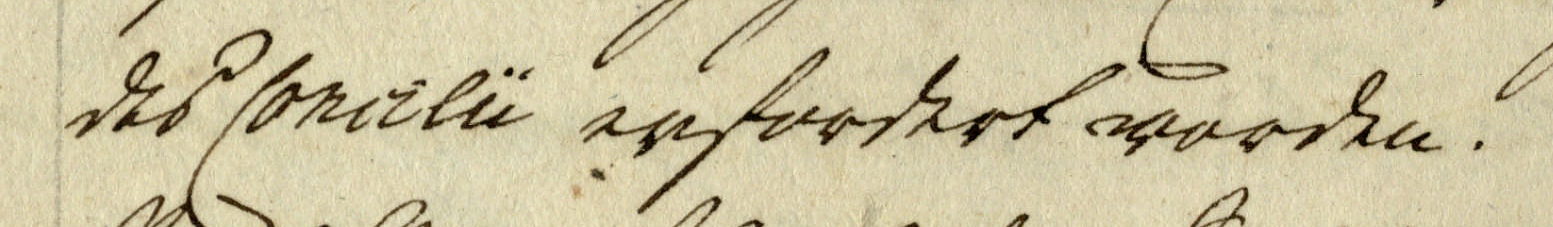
des Concilii erfordert worden.
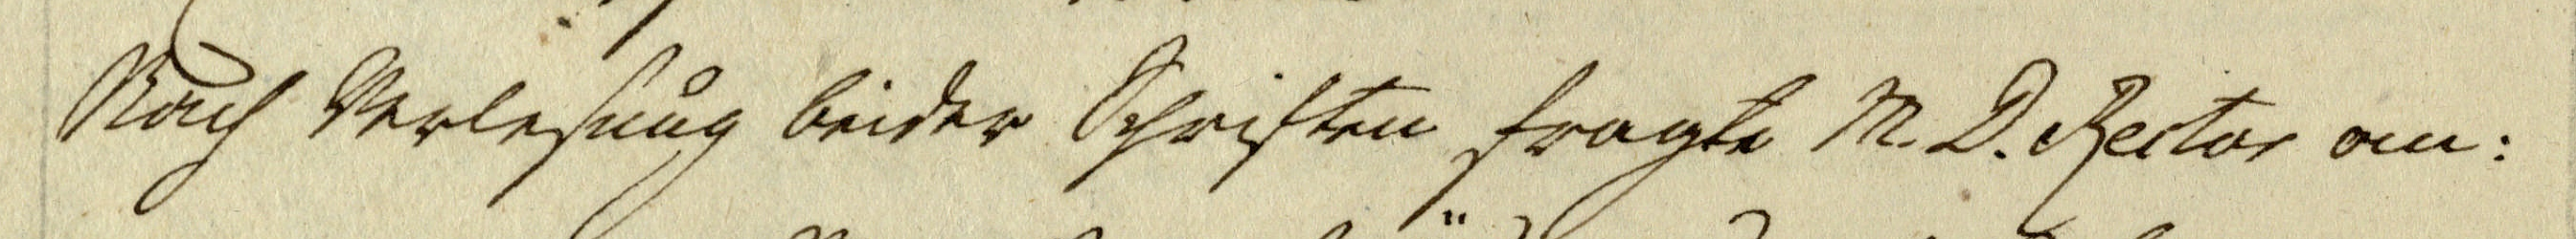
Nach Verlesung beider Schriften fragte M. D. Rector an:
